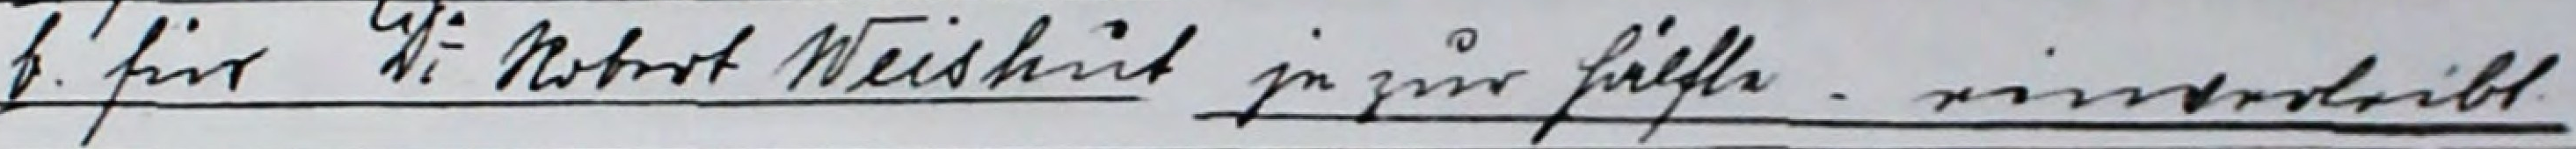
b. für Dr Robert Weishut je zur hälfte - einverleibt.
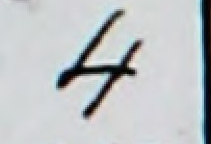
4
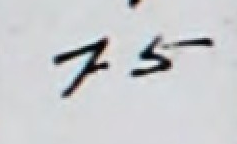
1. 5
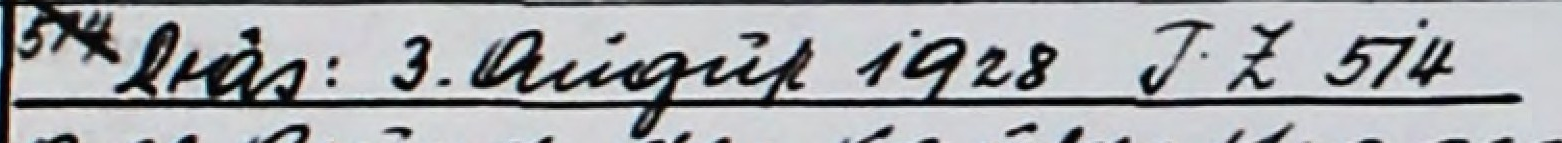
514 Präs: 3. August 1928 T.Z 514
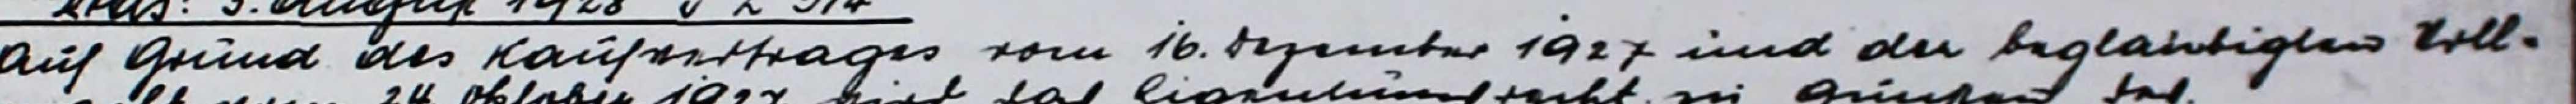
Auf Grund des Kaufvertrages vom 16. Dezember 1927 und der beglainbiglan Roll=
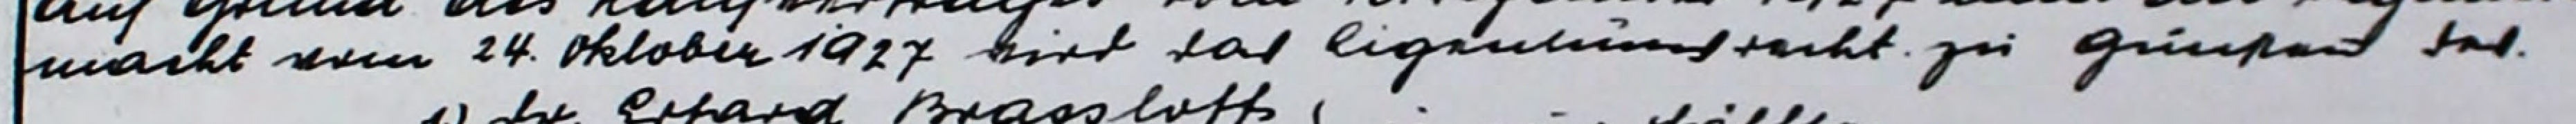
macht vom 24. Oktober 1927 wird das Eigentumsrecht zu Gunsten des.
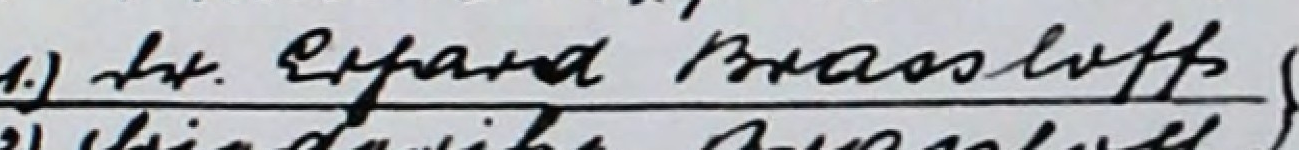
1.) Dr. Erhard Brassloff
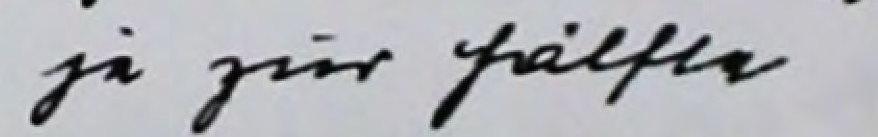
2) Friederike Brassloff
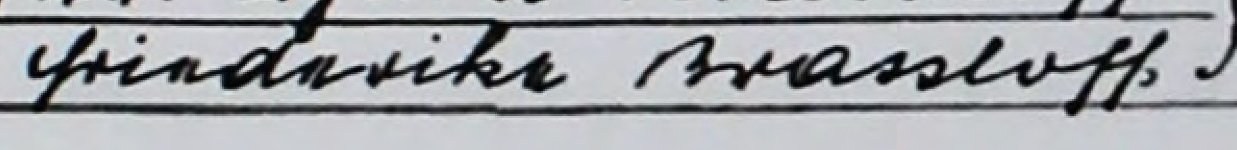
je zur hälfte
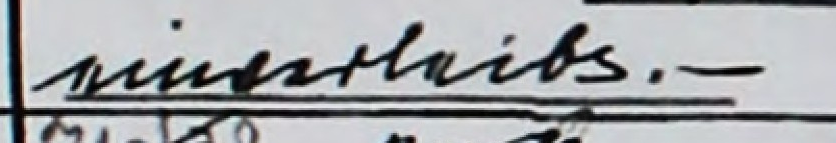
einverleibt.-
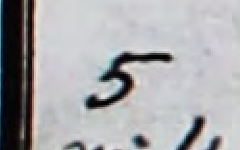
5
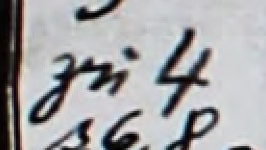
zu 4
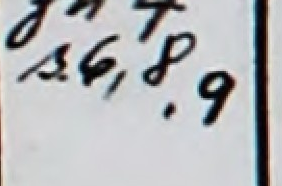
s. 6, 8, 9
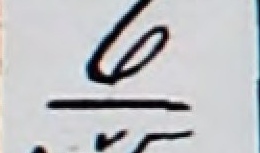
6
